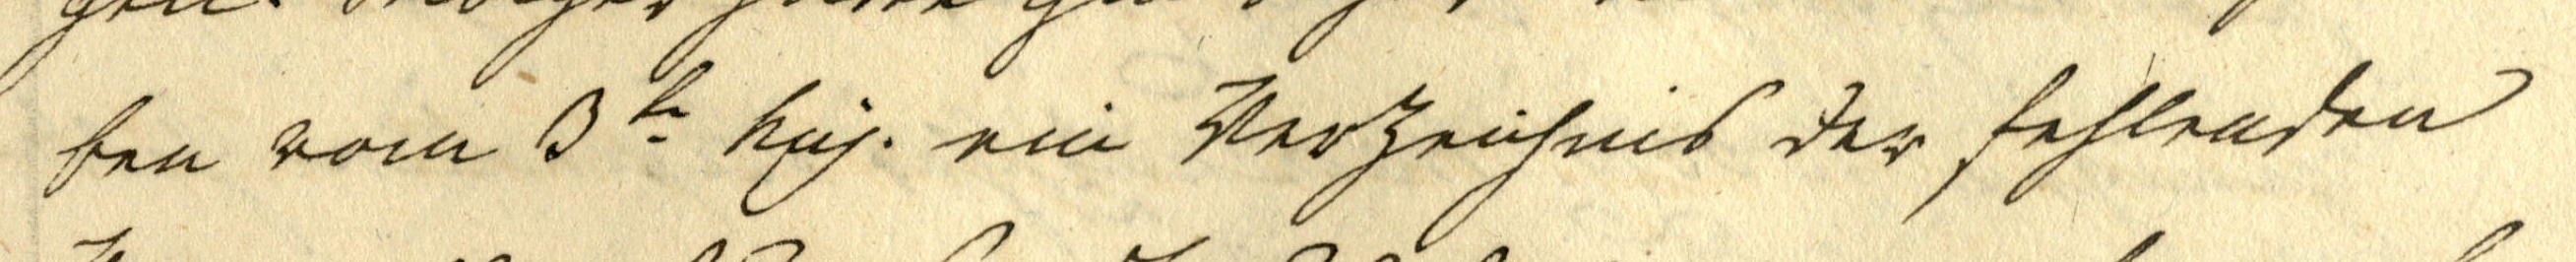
ben vom 3 t huj. ein Verzeichnis der fehlenden
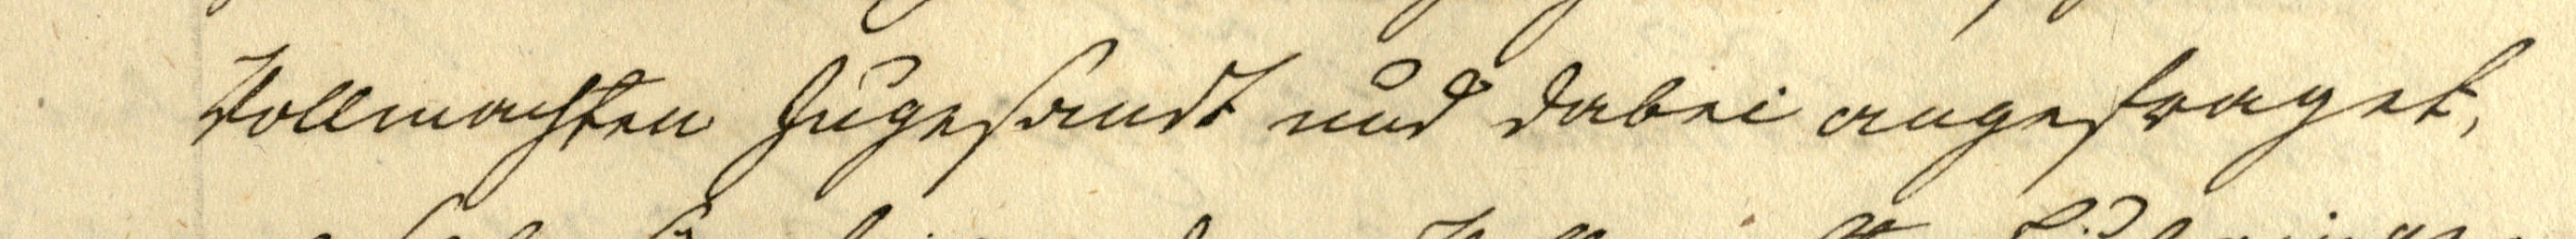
Vollmachten zugesandt und dabei angefraget,
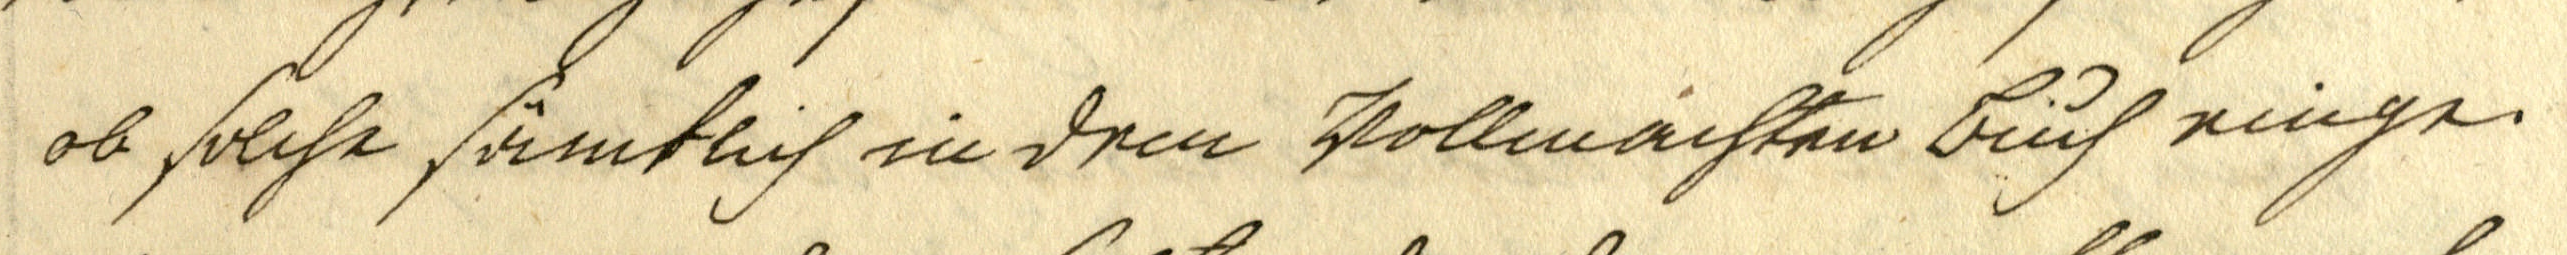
ob solche sämtlich in dem Vollmachten Buch einge¬
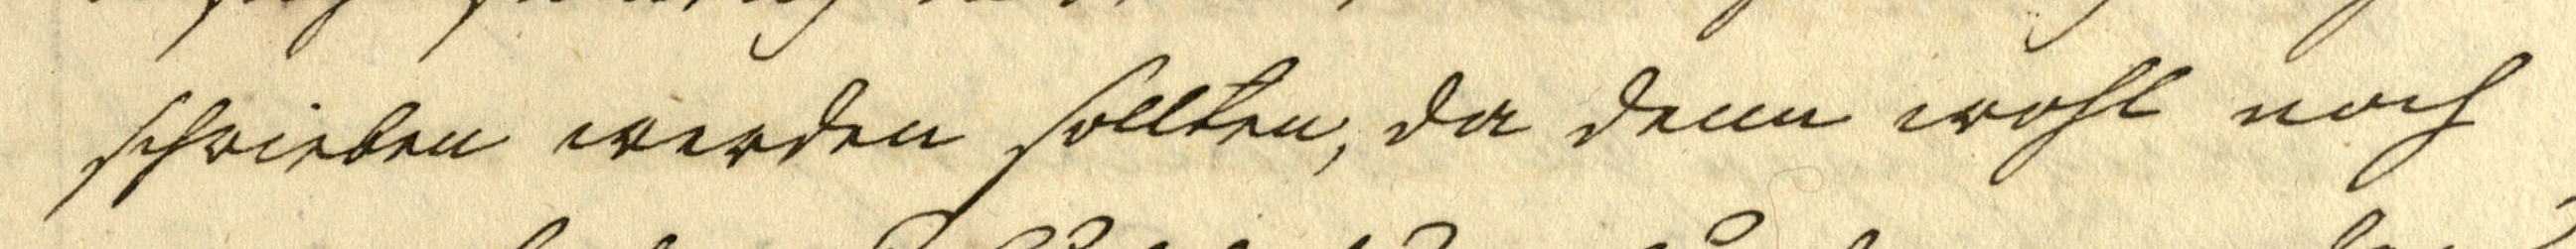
schrieben werden sollten, da denn wohl noch
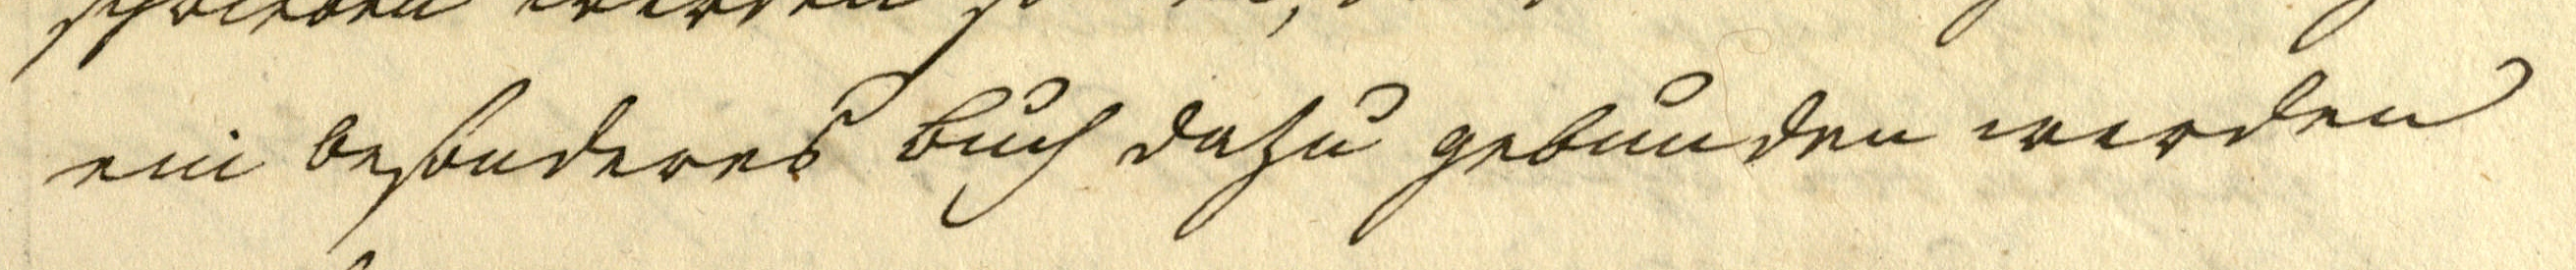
ein besonderes Buch dazu gebunden werden
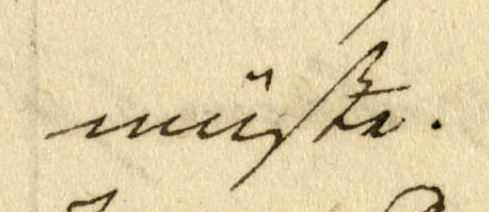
müßte.
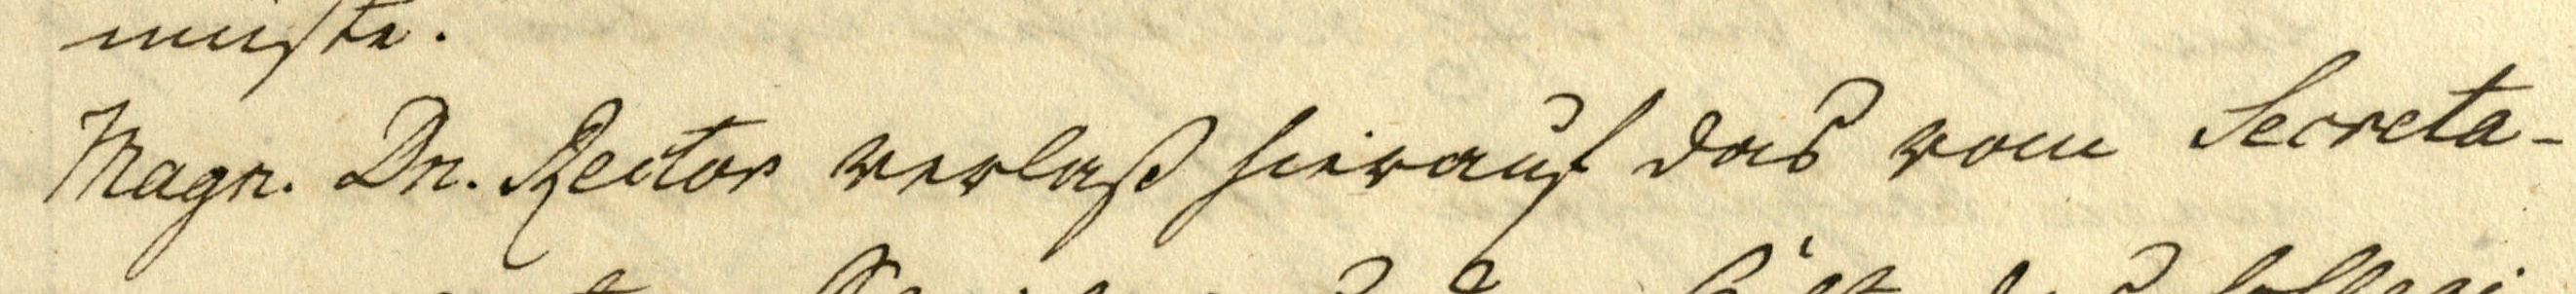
Magn. Dn. Rector verlaß hierauf das vom Secreta¬
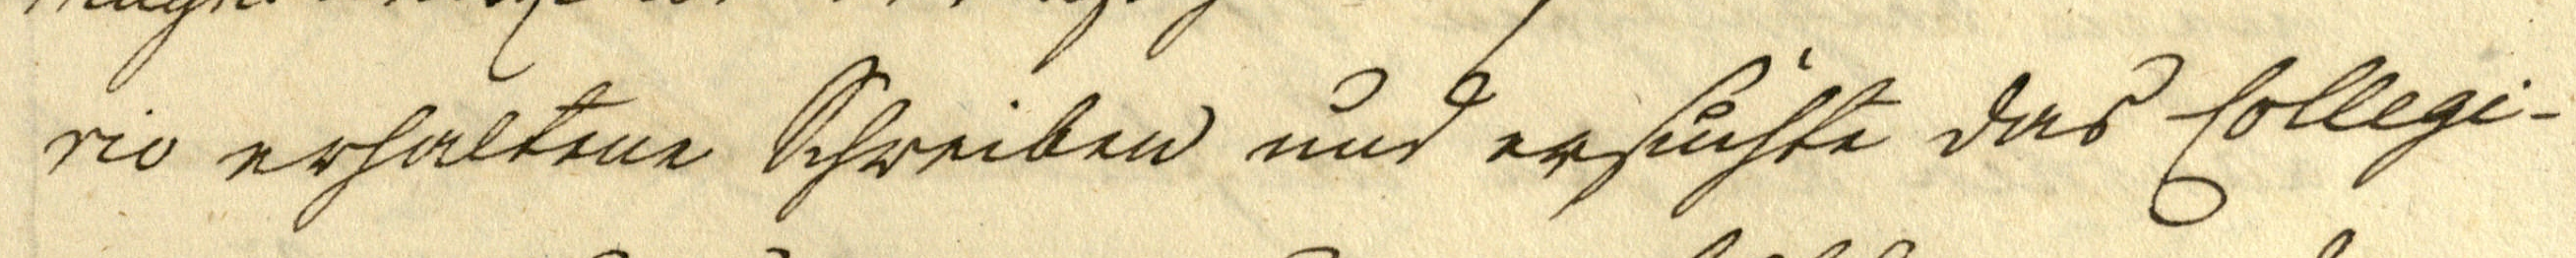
rio erhaltene Schreiben und ersuchte das Collegi¬
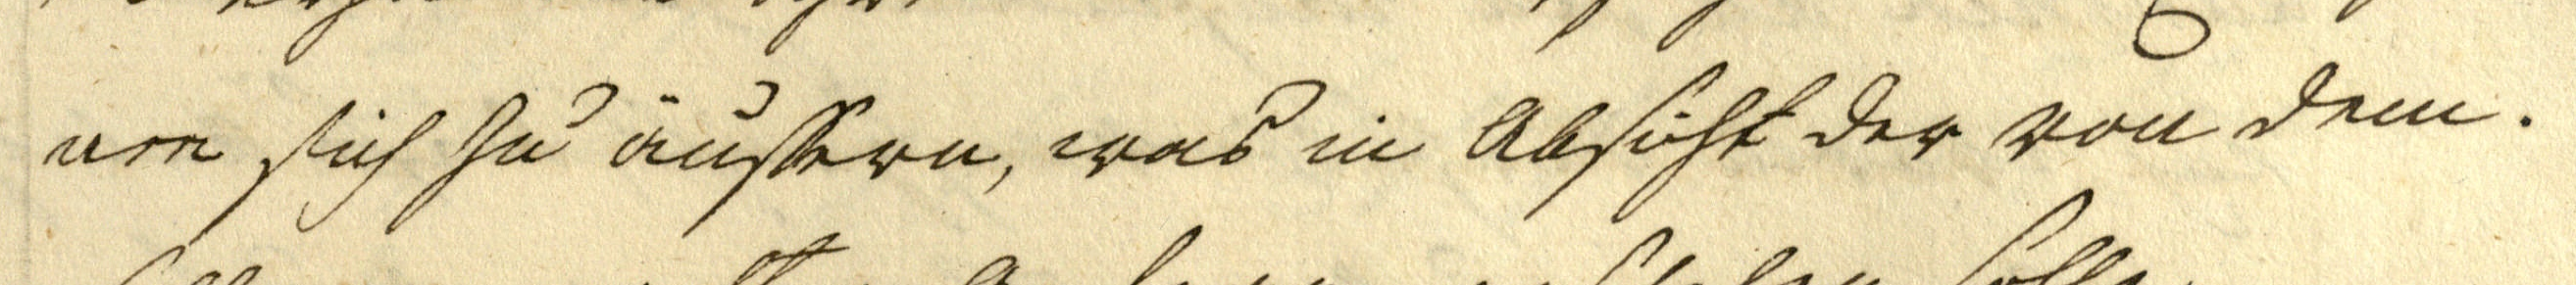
um sich zu äussern, was in Absicht der von dem¬
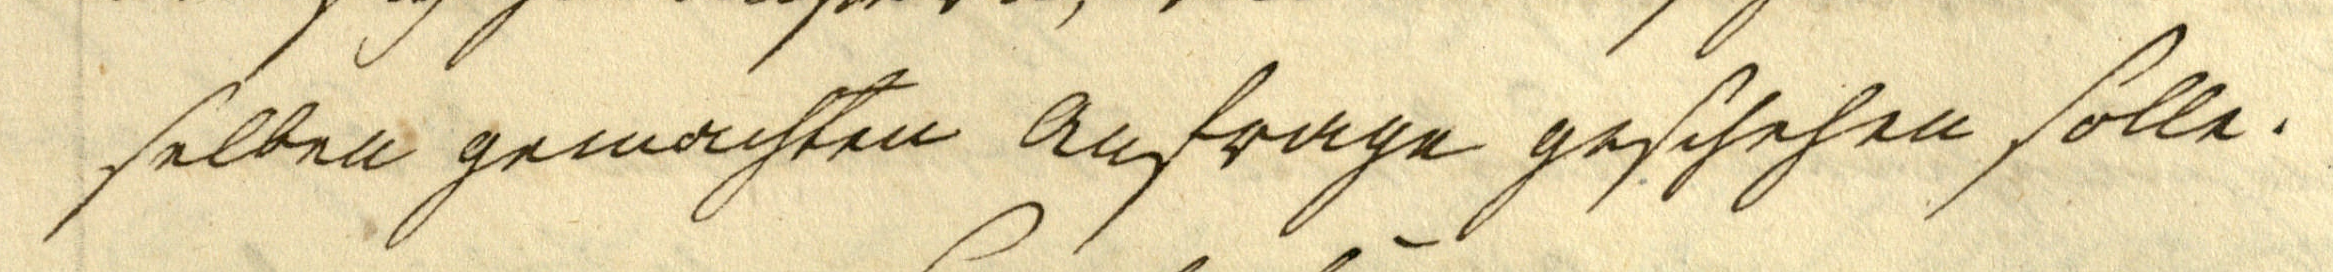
selben gemachten Anfrage geschehen solle.
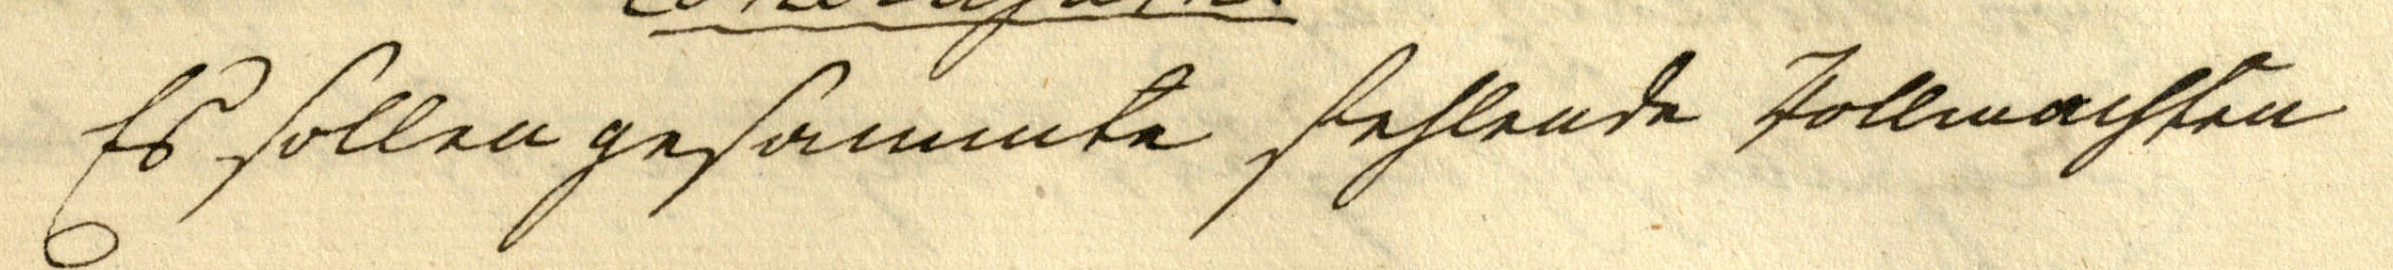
Es sollen gesammte fehlende Vollmachten
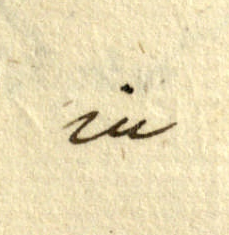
in
